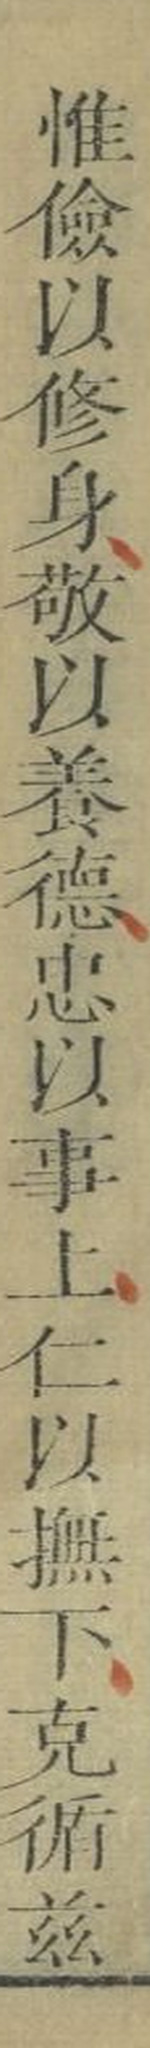惟倹以修身敬以養徳忠以事上仁以撫下克循茲
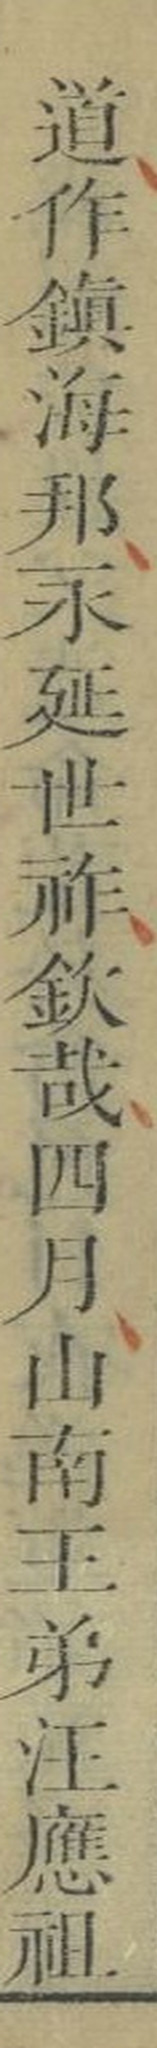道作鎮海邦永延世祚欽哉四月山南王弟汪応祖
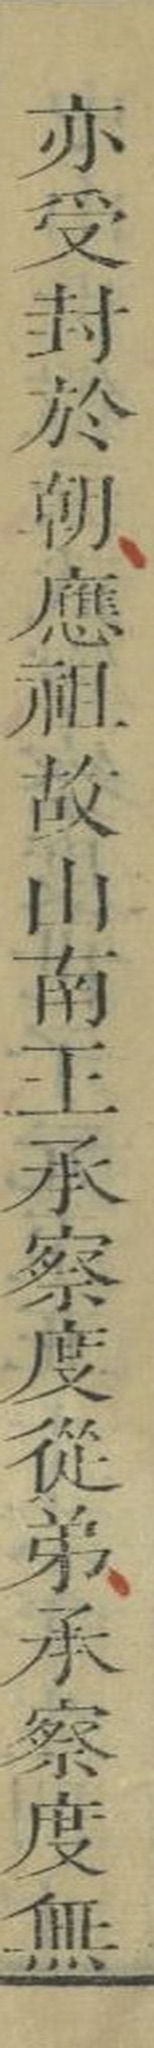亦受封於朝応祖故山南王承察度従弟承察度無
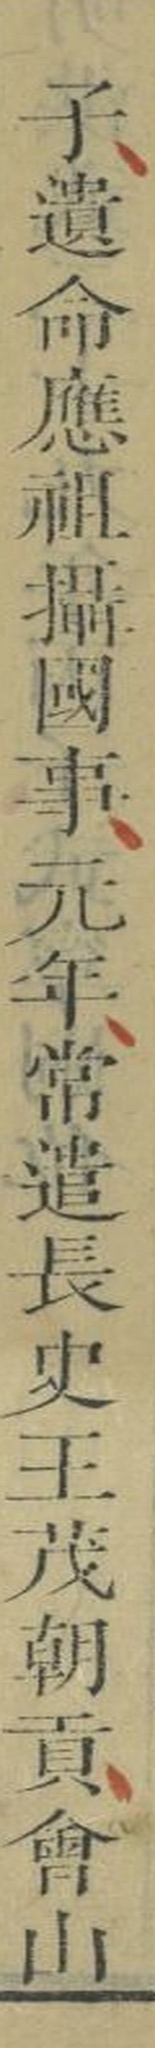子遺命応祖摂国事元年常遣長史王茂朝貢会山
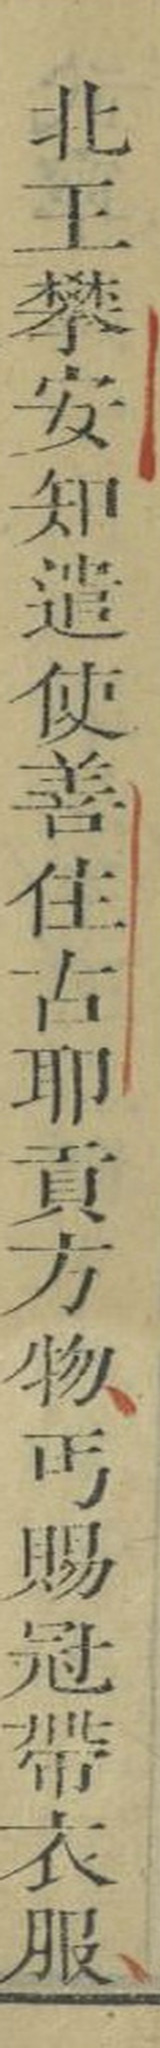北王攀安知遣使善住古耶貢方物丐賜冠帯衣服
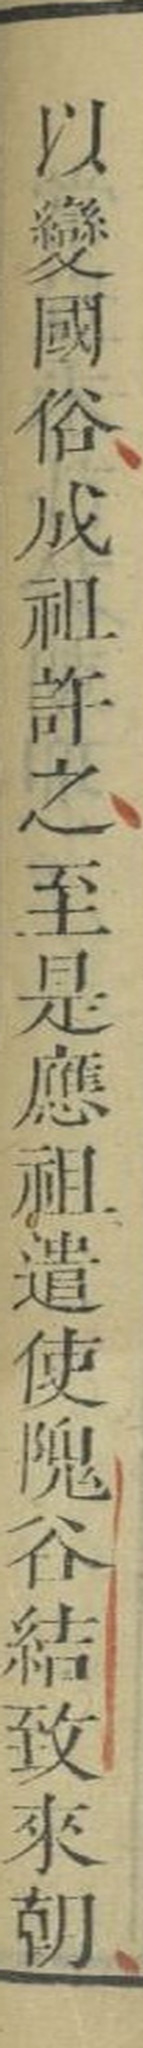以変国俗成祖許之至是応祖遣使隗谷結致来朝
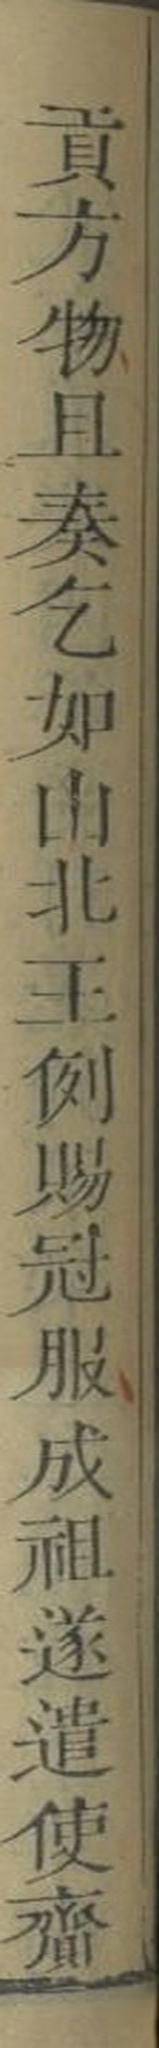貢方物且奏乞如山北王例賜冠服成祖遂遣使齎
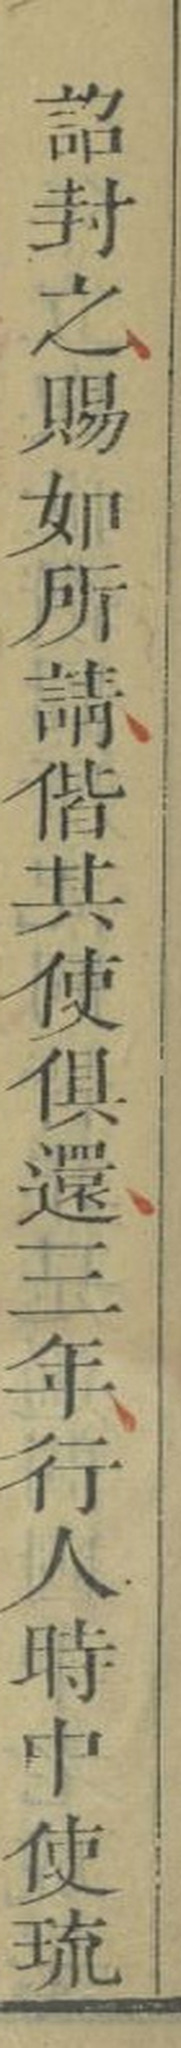詔封之賜如所請偕其使俱還三年行人時中使琉
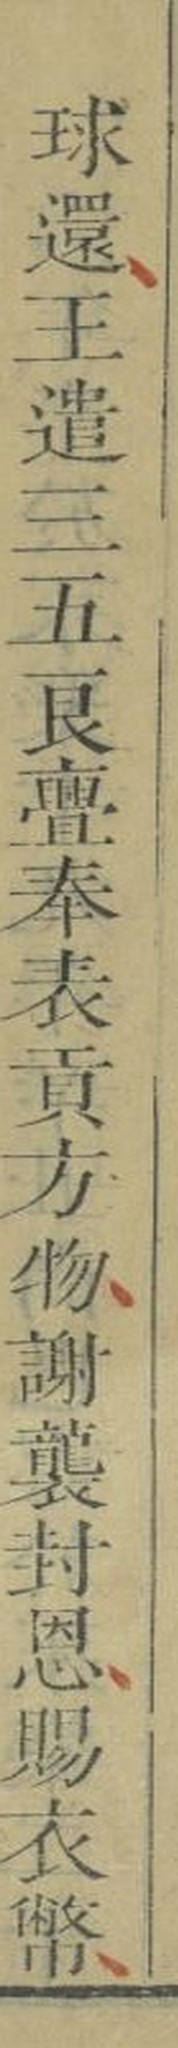球還王遣三五良亹奉表貢方物謝襲封恩賜衣幣
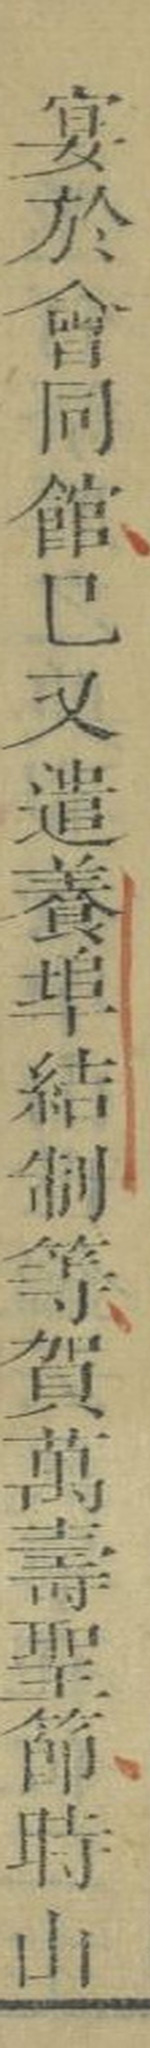宴於会同館巳又遣養埠結制等賀万寿聖節時山
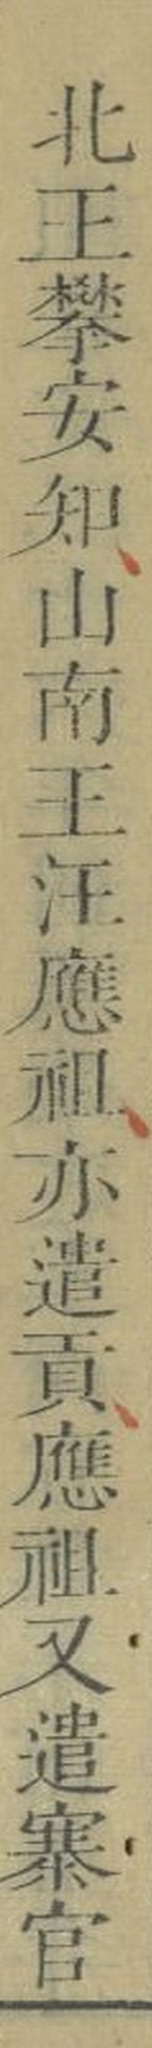北王攀安知山南王汪応祖亦遣貢応祖又遣寨官
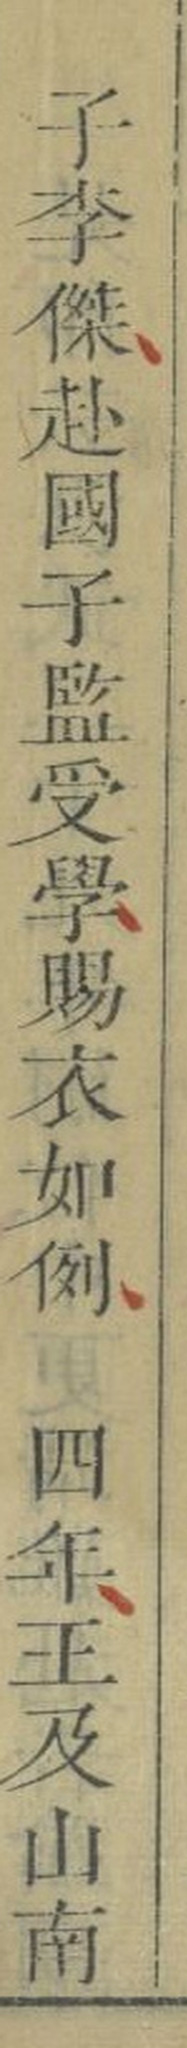子李傑赴国子監受学賜衣如例四年王及山南
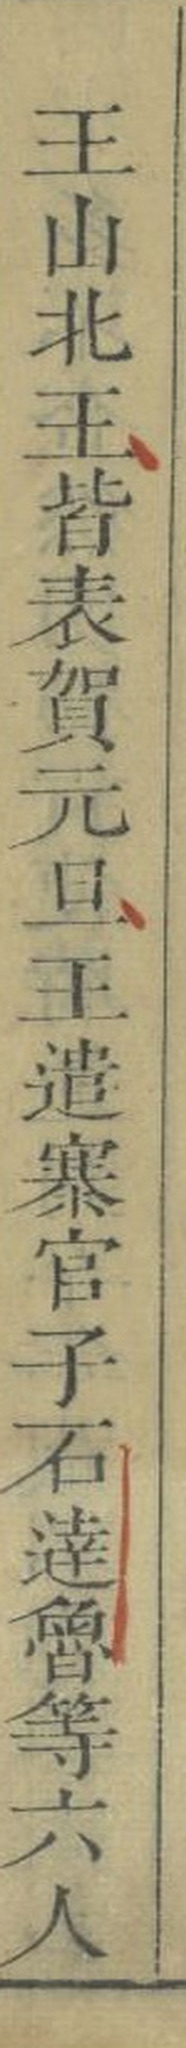王山北王皆表賀元旦王遣寨官子石達魯等六人
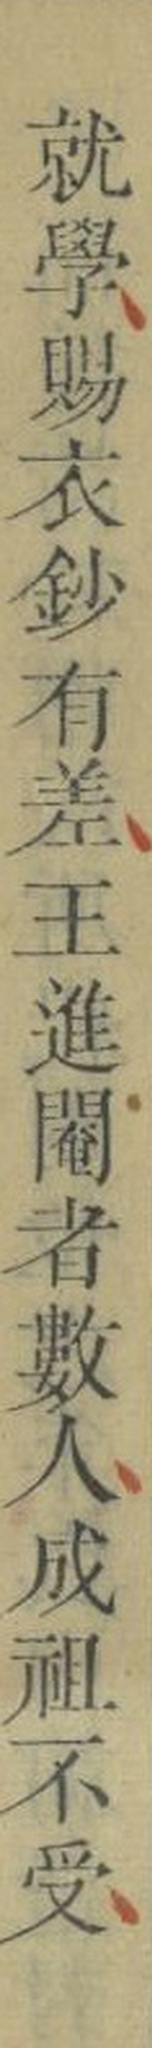就学賜衣鈔有差王進閹者数人成祖不受
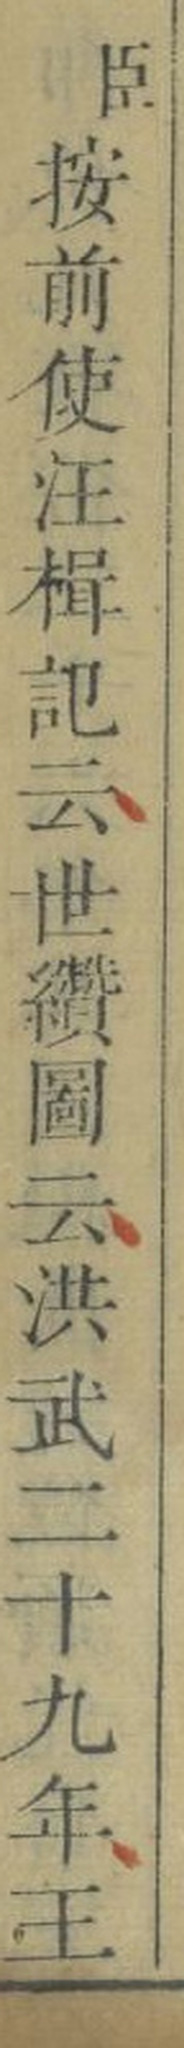臣按前使汪楫記云世纘図云洪武二十九年王

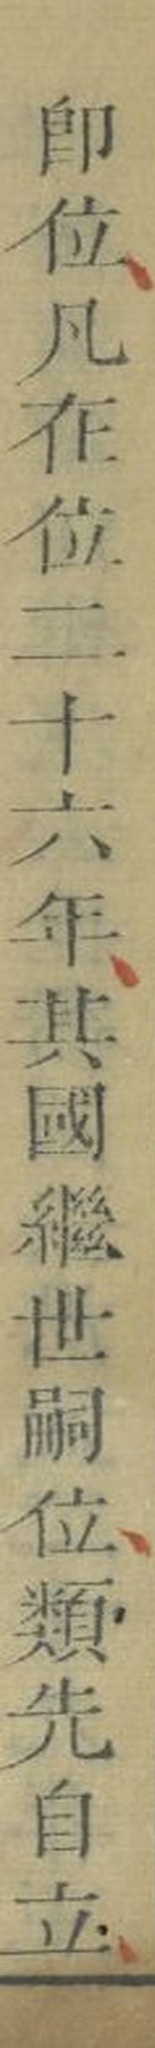即位凡在位二十六年其国継世嗣位類先自立
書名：中山伝信録 巻三
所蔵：University of the Ryukyus Library
